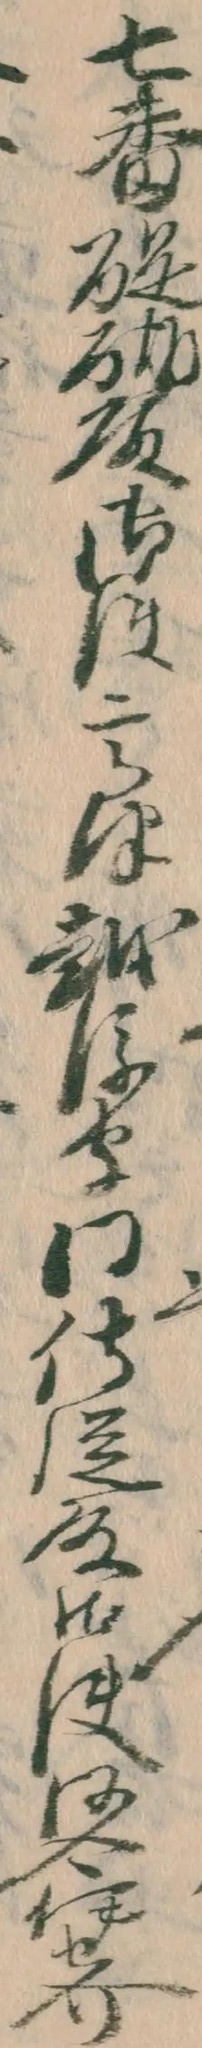七番醍醐殿御使い高津越後守同傳従殿御使同入伊勢介
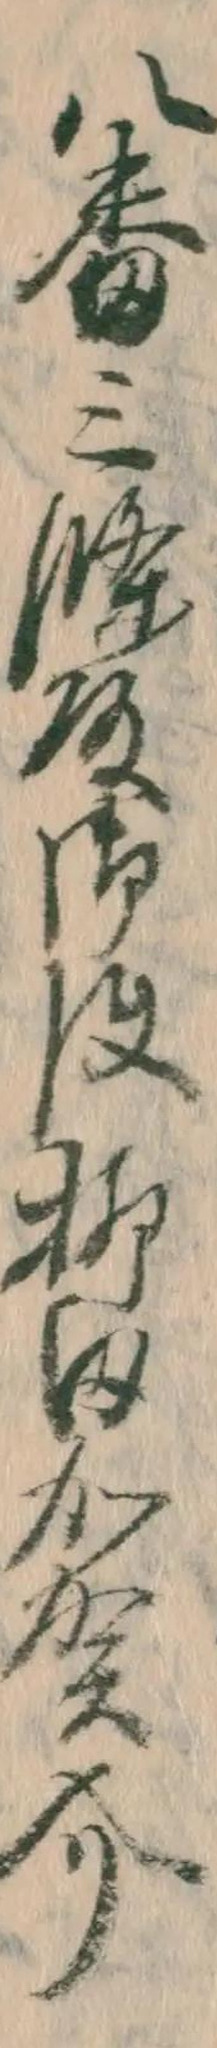八番三條殿御使柳田加賀介
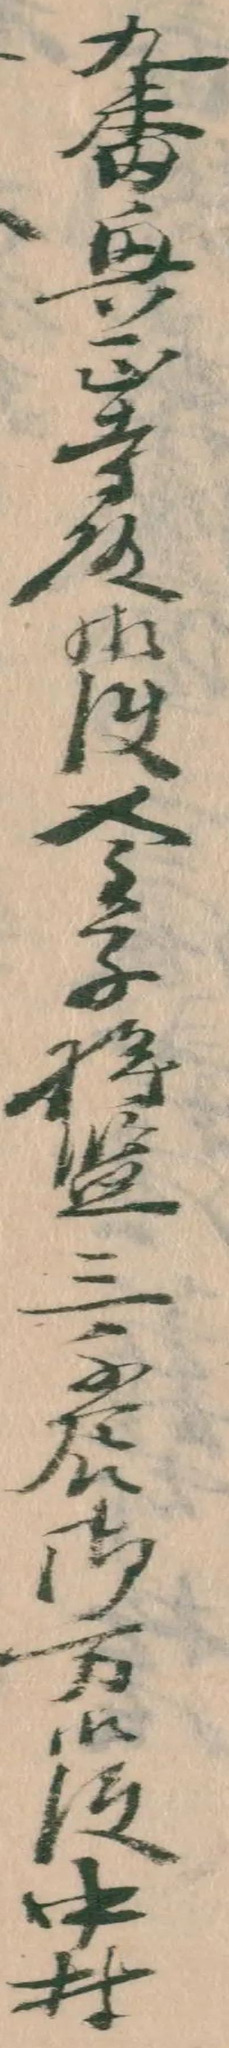九番興正寺殿御使金子将監三千君御方御使中村
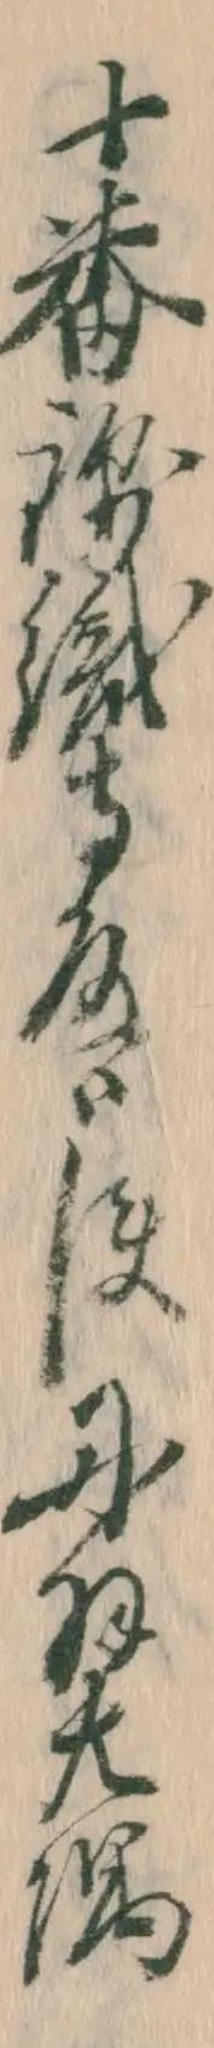十番錦織寺殿御使丹羽大隅
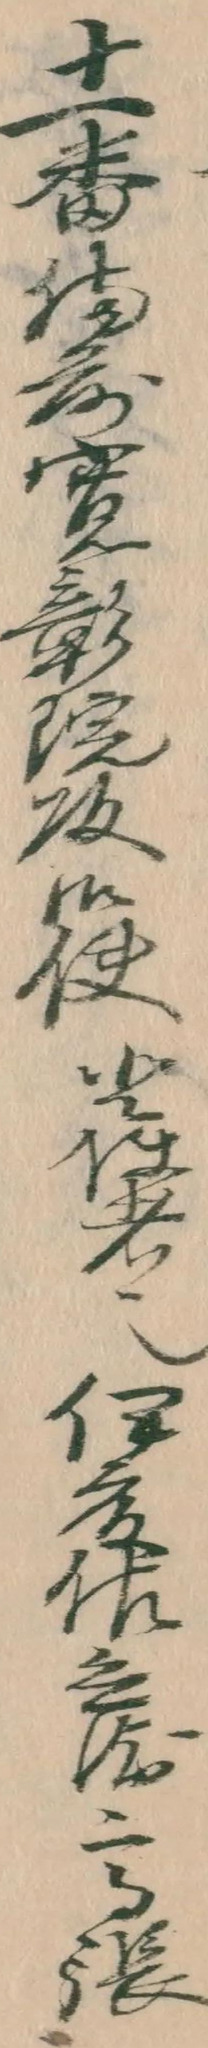十一番備前寛彰院殿御使座使者也伊藤佐兵衛高張
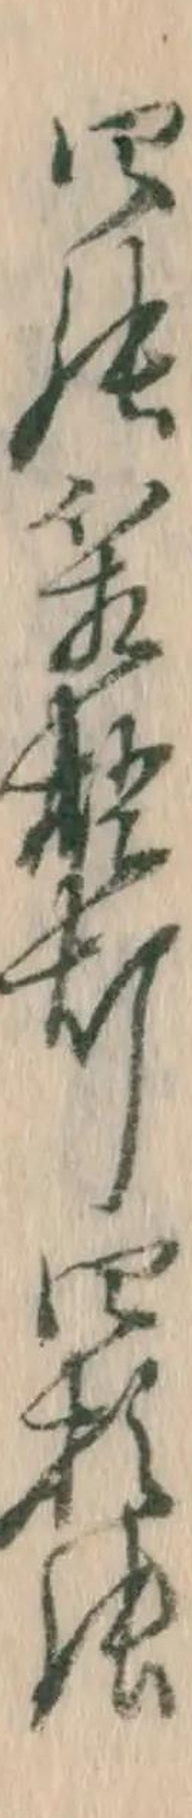四張箱燈灯四拾張
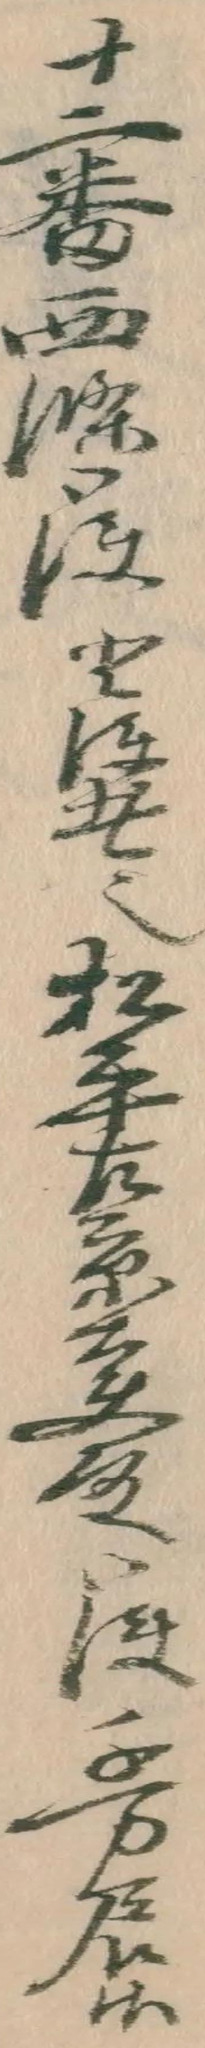十二番西條御使座使者也松平左京大夫殿御使千万君御
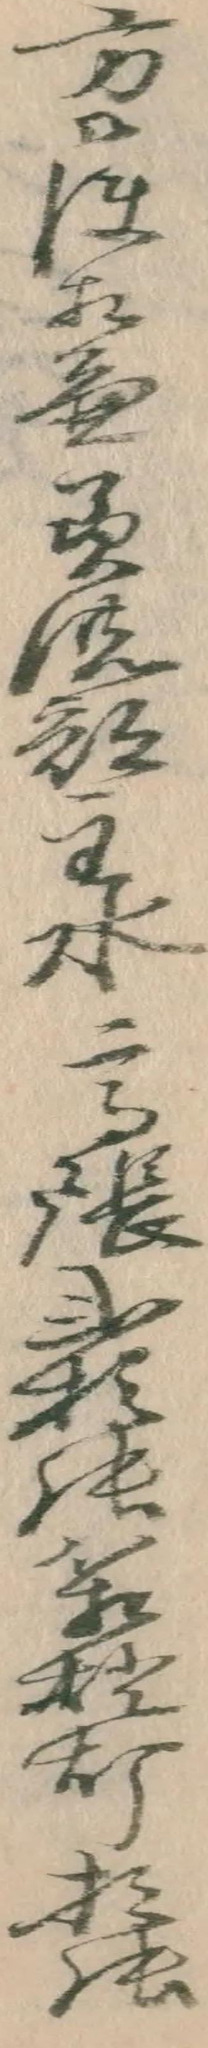方御使相兼美濃部主水高張弐拾張箱提灯拾張
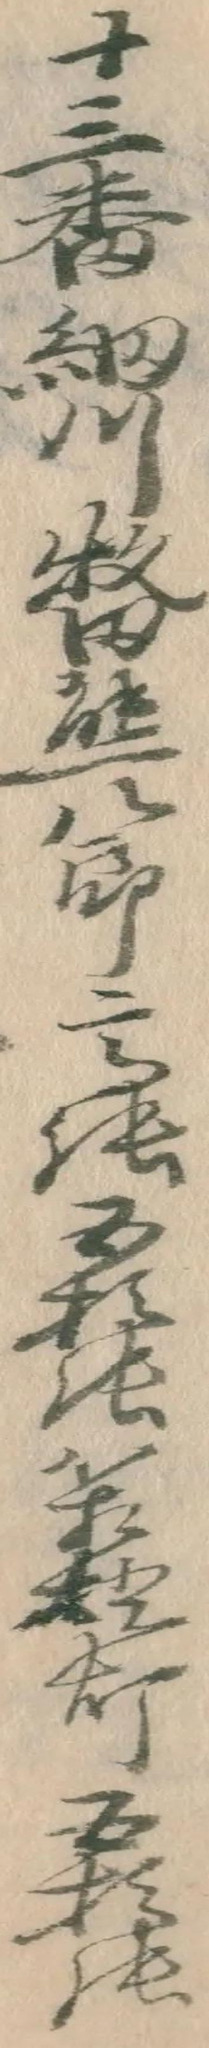十三番細川牧田熊八郎高張五拾張箱燈灯五拾能
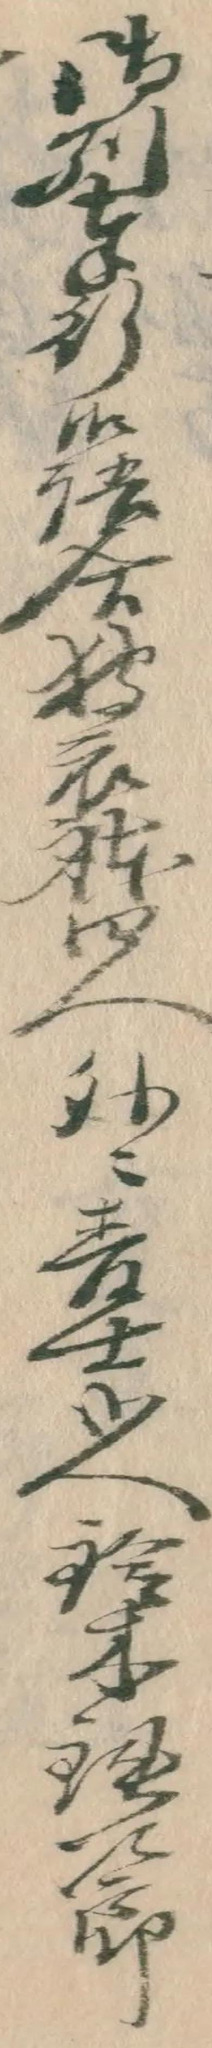御列奉行御語合狩衣躰四人外に吉士弐人鈴木鑓次郎
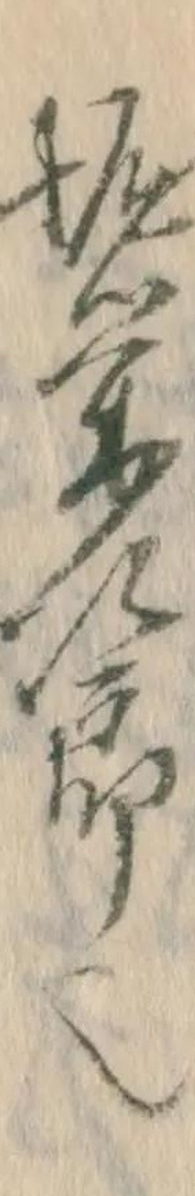堀栄次郎也
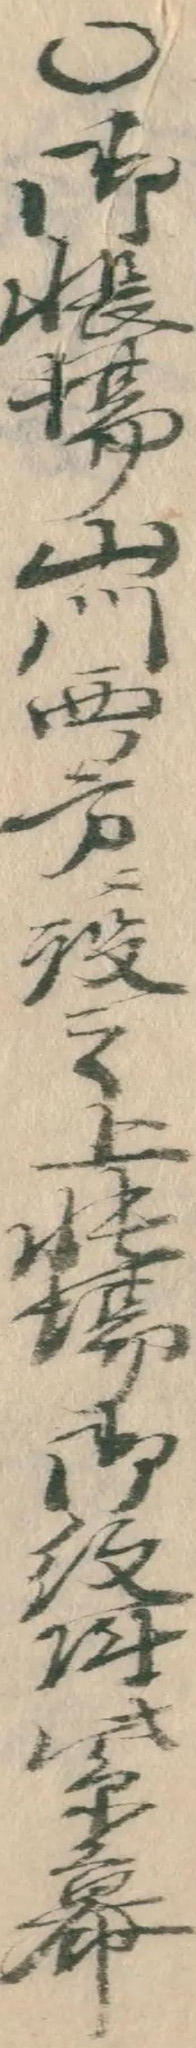○御帳場山門西ノ方ニ設之上帳場御紋附紫幕
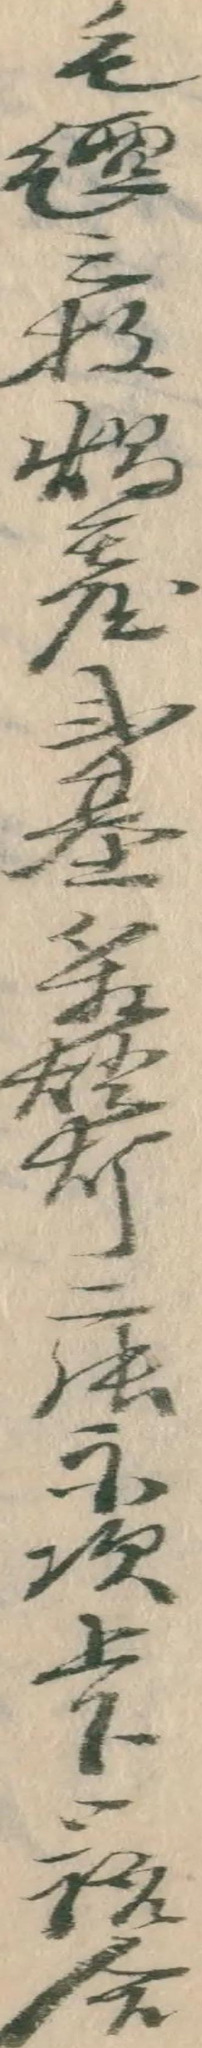毛氈三枚燭台弐基箱燈灯二張取次上下御語合
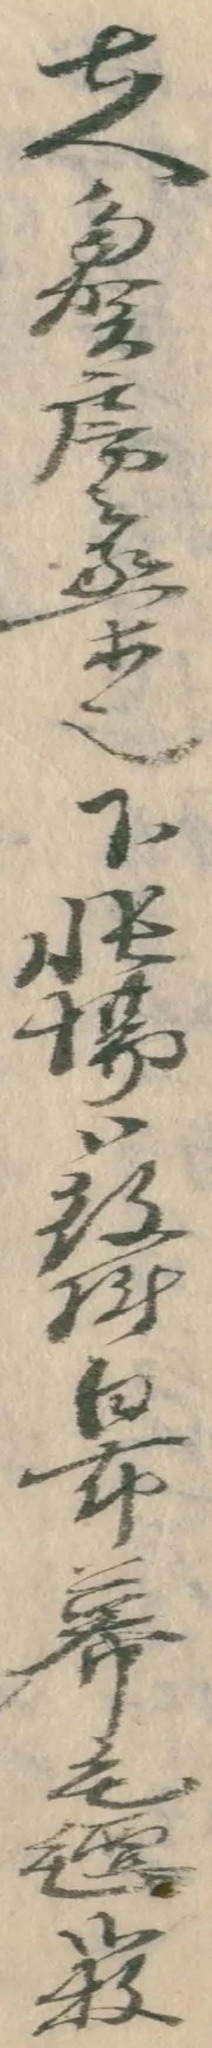七人多賀房之丞等也下帳場御役附白布幕毛氈弐枚
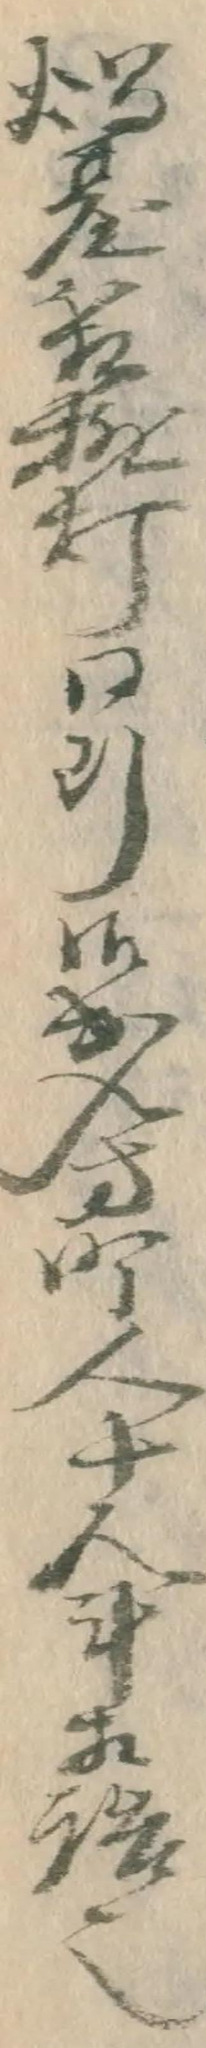燭臺箱挑灯同断御出入方町人十人斗相語也

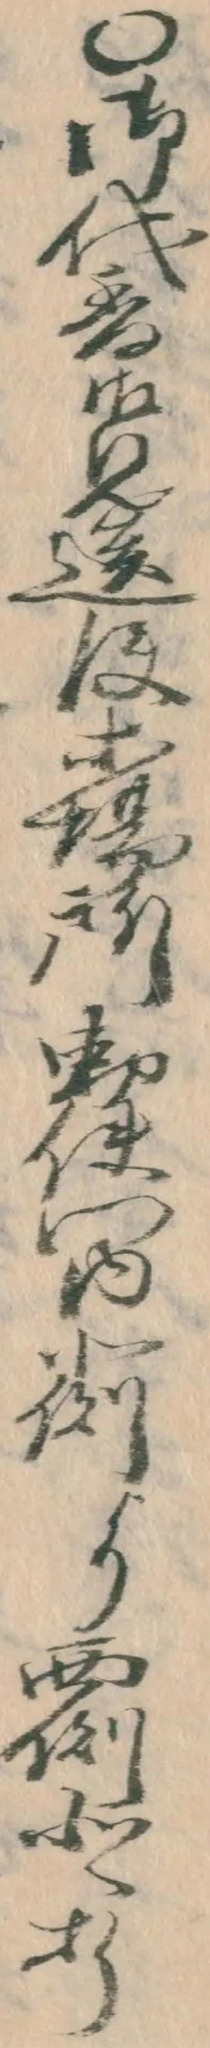○御代番御見送役等場所勅使門内北側より西側北へ折
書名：賀茂社記録. 第67冊
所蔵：国立国会図書館 National Diet Library, JAPAN
